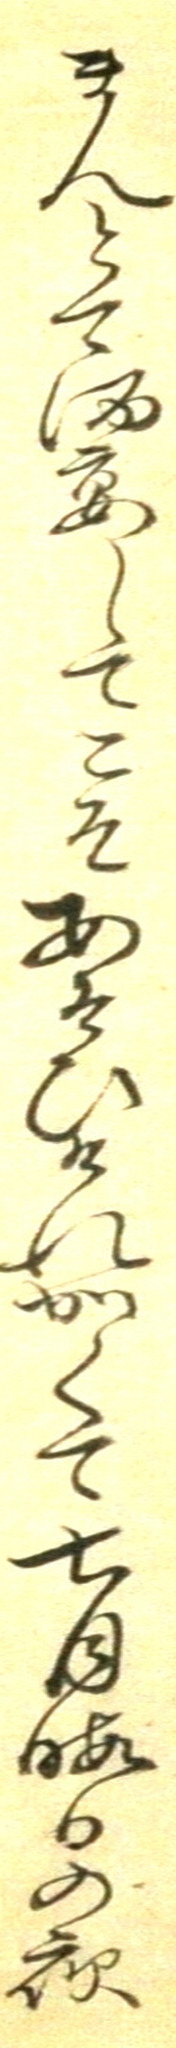まんとて酒宴してこそあそひけれかくて七月晦日の夜
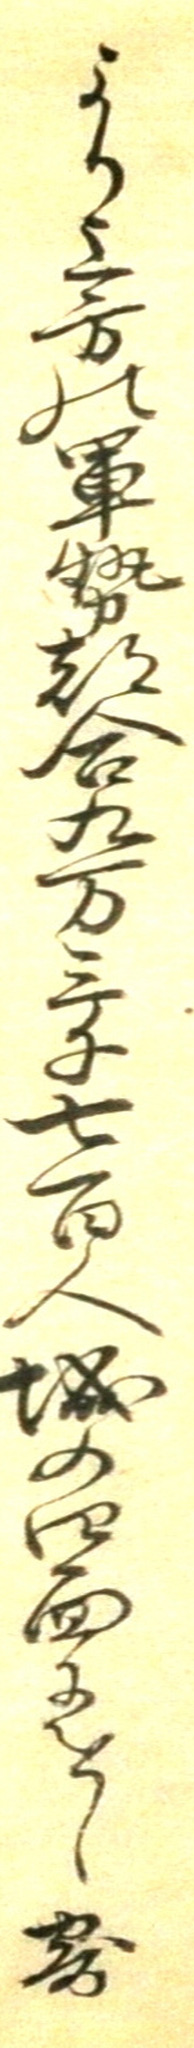より上方の軍勢都合九万三千七百人城の四面にをし寄
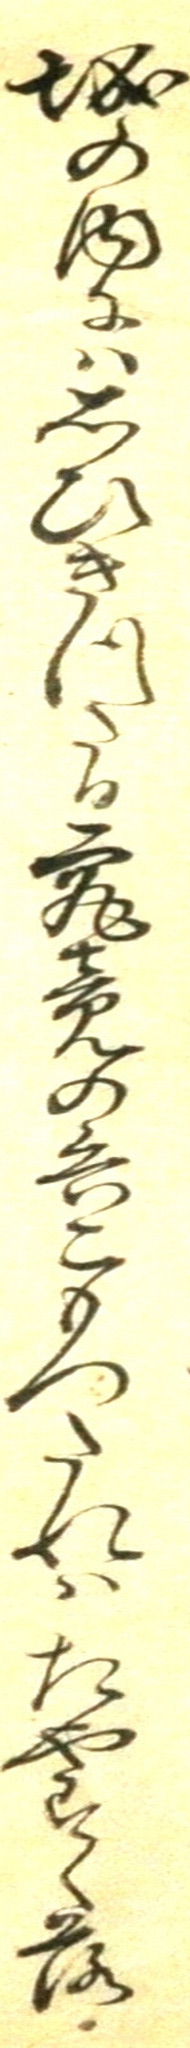城の内には思ひきつたる究竟の兵こもつたれはたやすく落
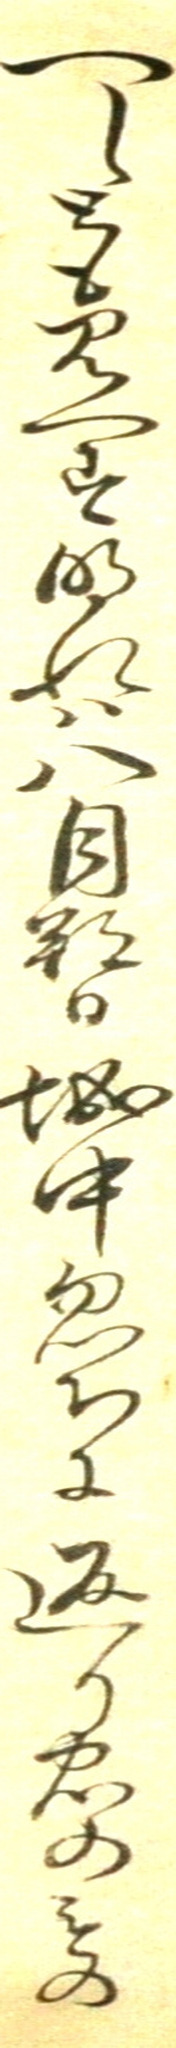へしとも見へす明れは八月朔日城中忽ちに返り忠のもの
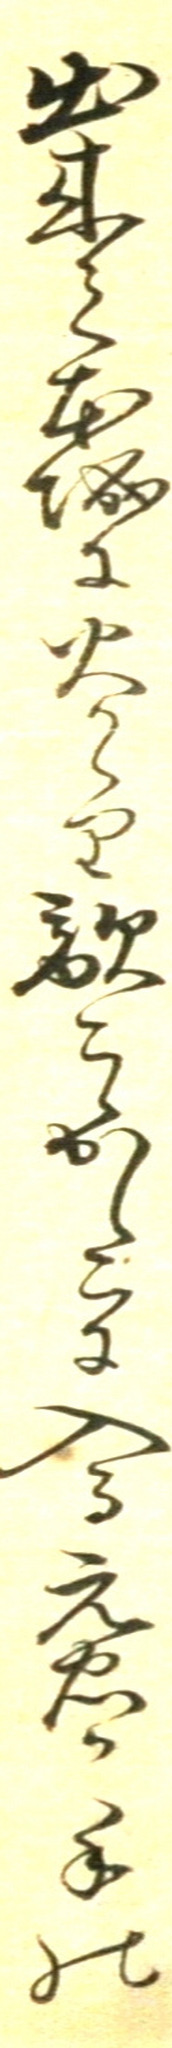出来て本城に火かゝり敵こゝかしこに入る元忠か手の
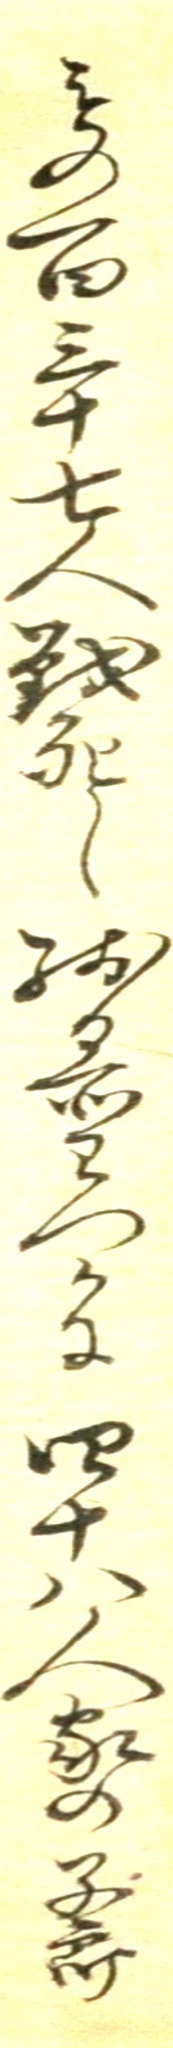もの百三十七人戦死し残る所わつかに四十八人家の子郎
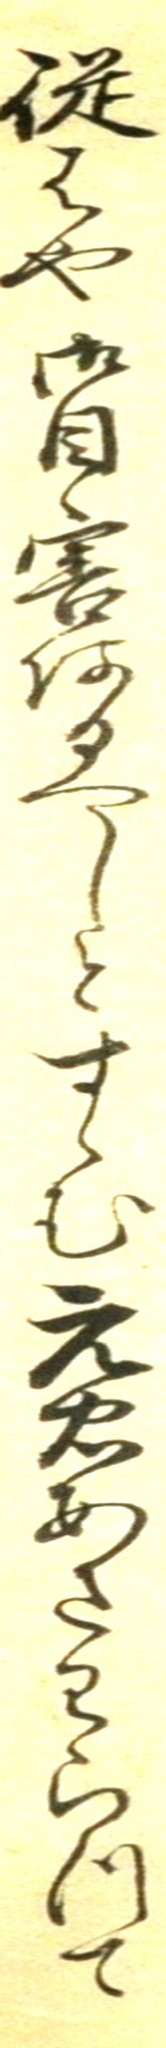従はや御自害あるへしとすゝむ元忠あさわらつて
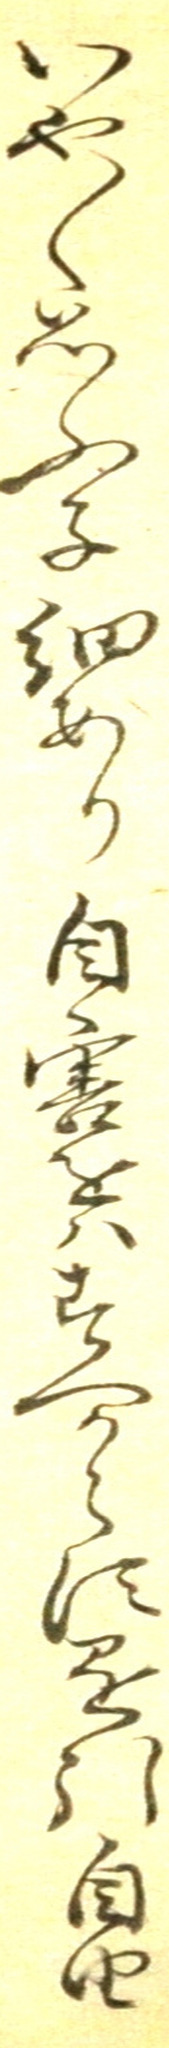いや〳〵思ふ子細あり自害をはすへからす懸引自由
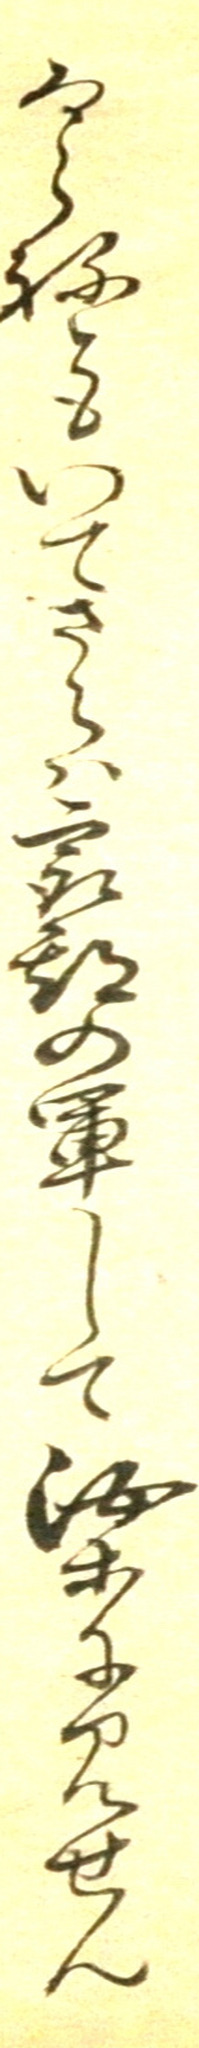ならねともいてさらは最期の軍して汝等に見せん
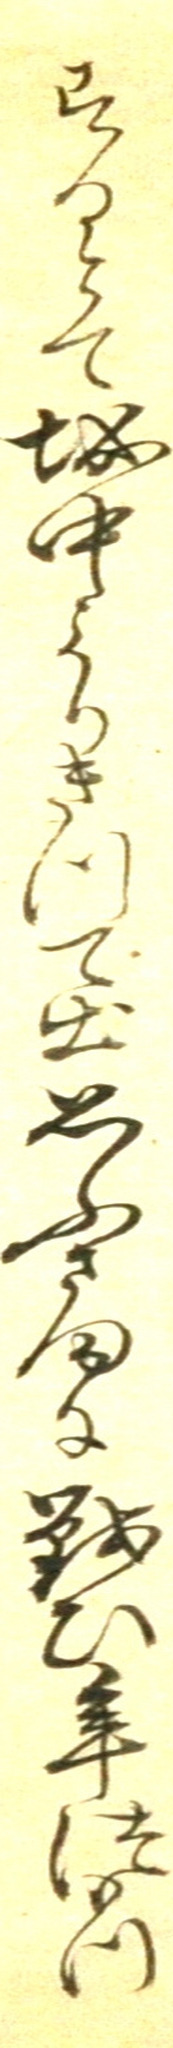するとて城中よりきつて出思ふさまに戦ひ年つもつ
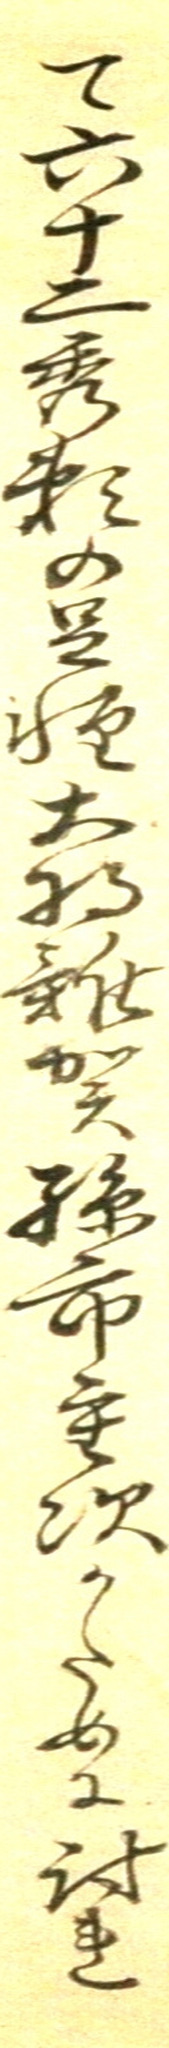て六十二秀頼の足軽大将雑賀孫市重次かために討れ
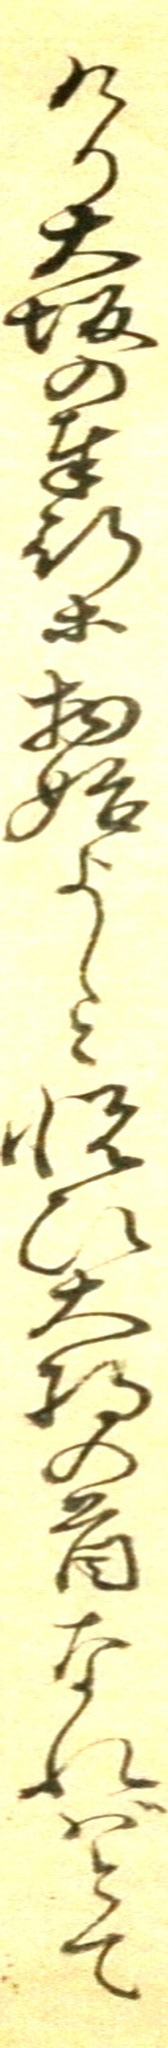けり大坂の奉行等物始よしと悦ひ大将の首なればとて
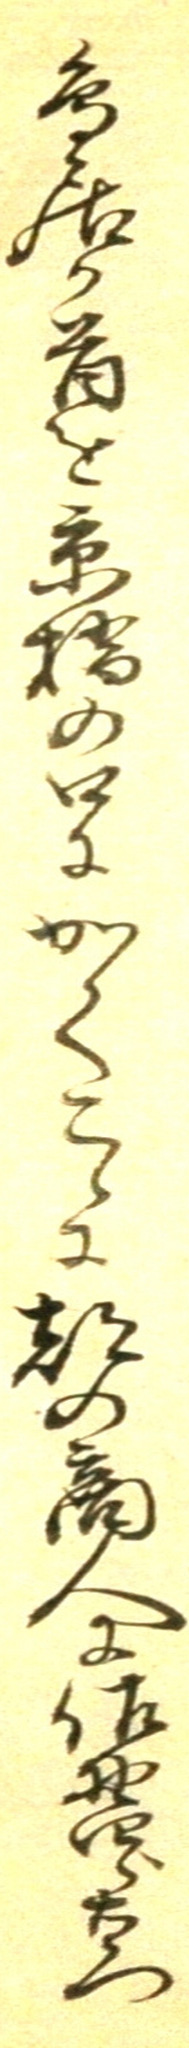鳥居か首を京橋の口にかくこゝに都の商人に佐野四郎右衛門
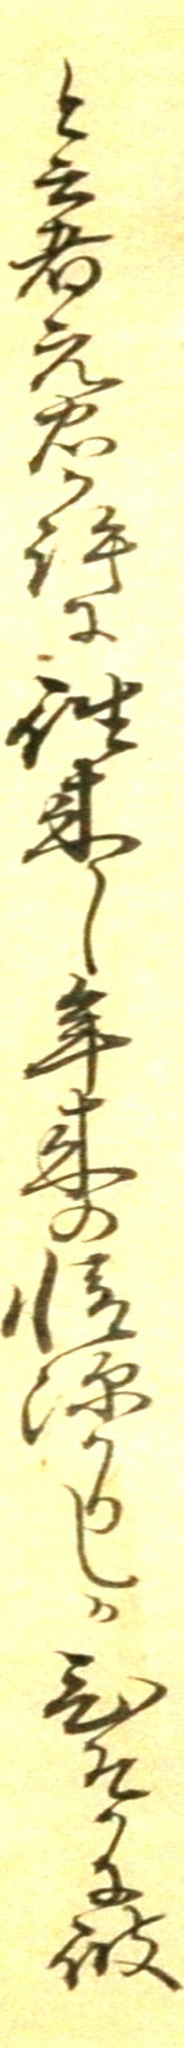と云者元忠か許に往来し年来の情深かりしかひそかに彼
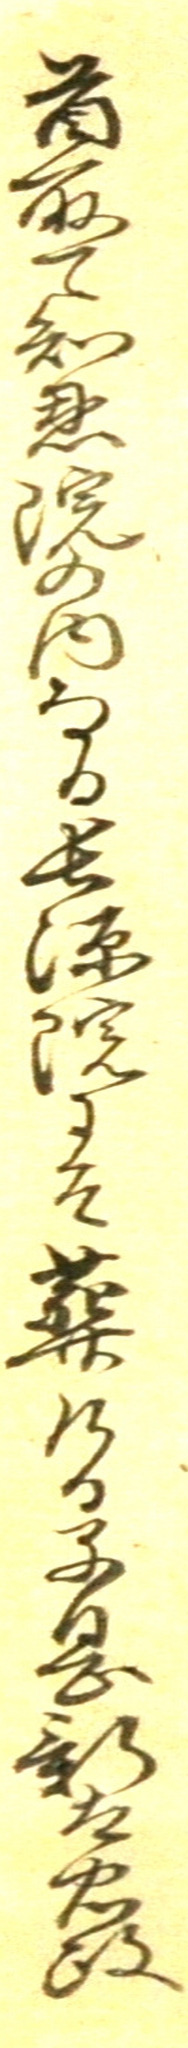首取て知恩院の内なる長源院にそ葬りける子息新太郎忠政

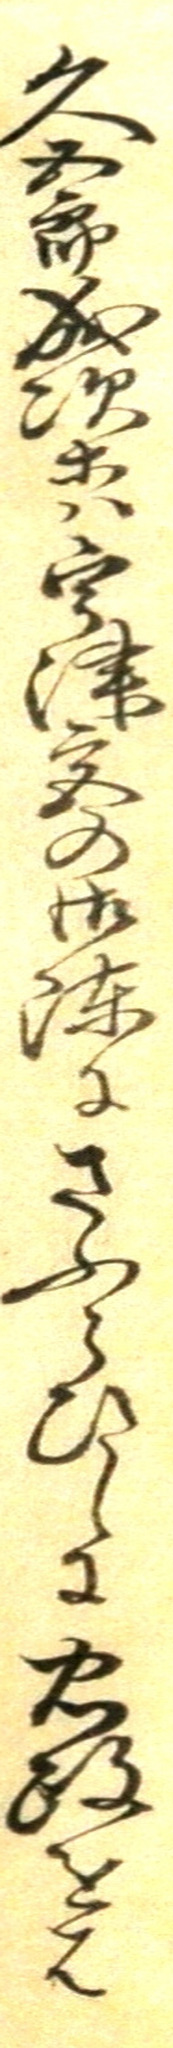久五郎成次等は宇津宮の御陣にさふらひしに忠政をは
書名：藩翰譜（四・中）
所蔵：伊那市立高遠町図書館・合同会社AMANE
